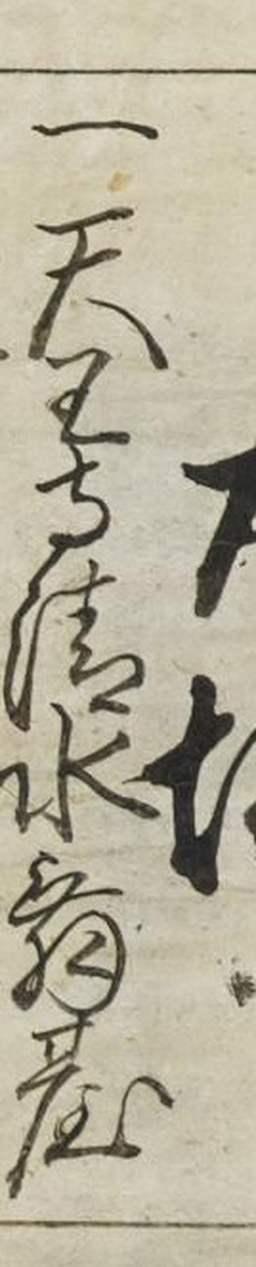一天王寺清水舞台
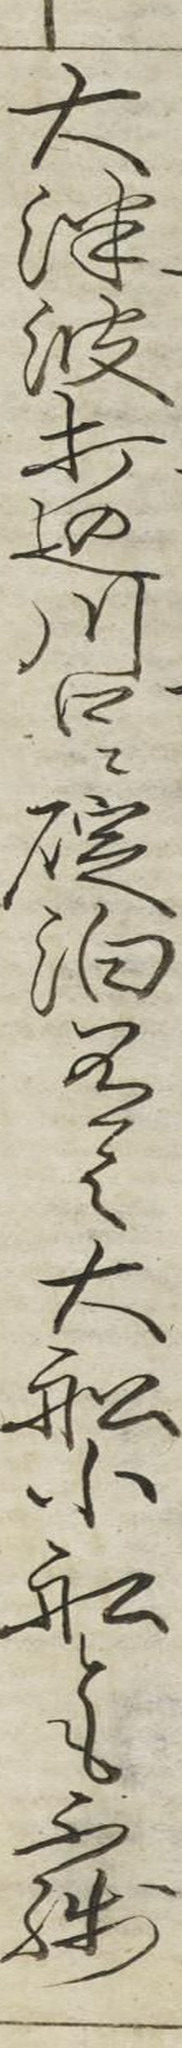大津波打込川口ニ碇泊有之大船小船とも不残
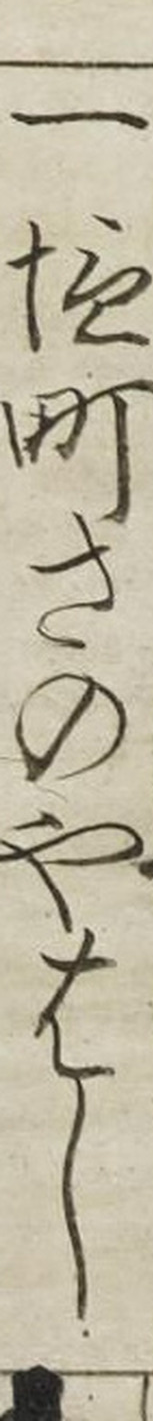一塩町さのやはし
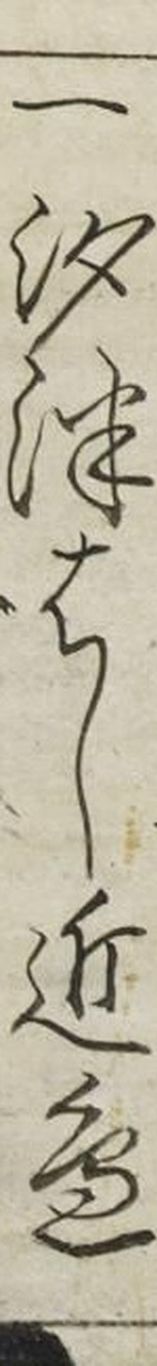一汐津はし近辺
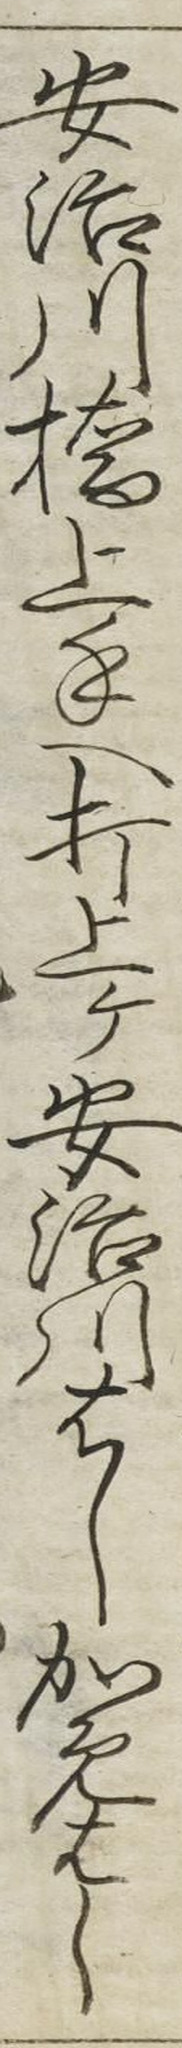安治川橋上手へ打上ケ安治川はしかめはし
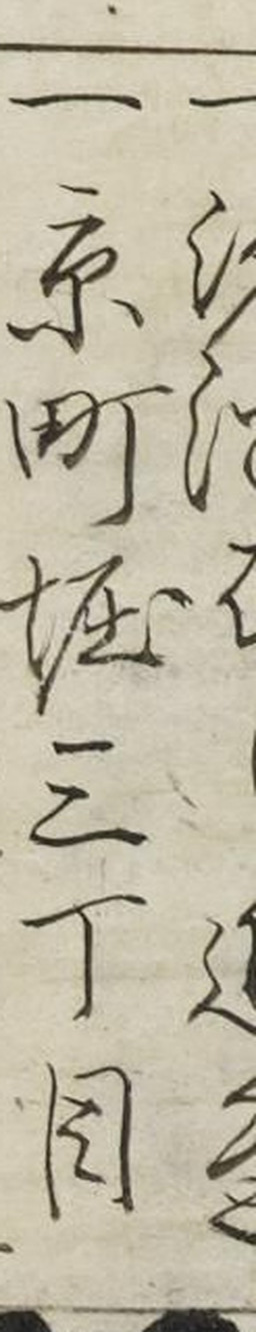一京町堀三丁目
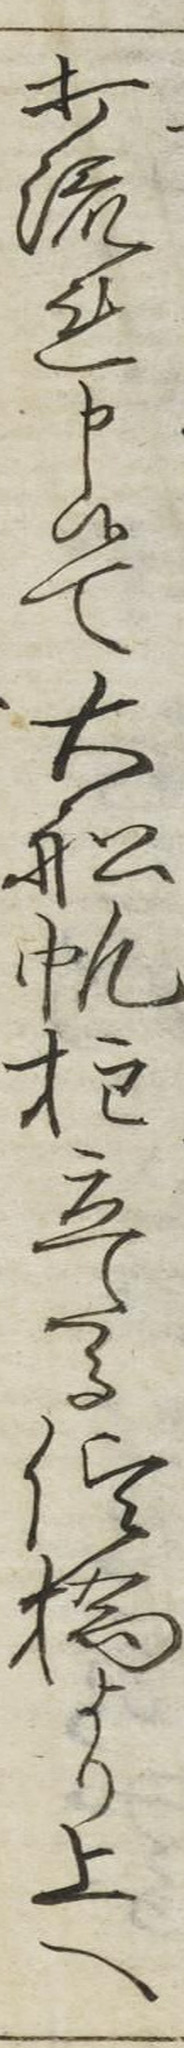打流れ申候て大船帆柱立たる侭橋より上へ
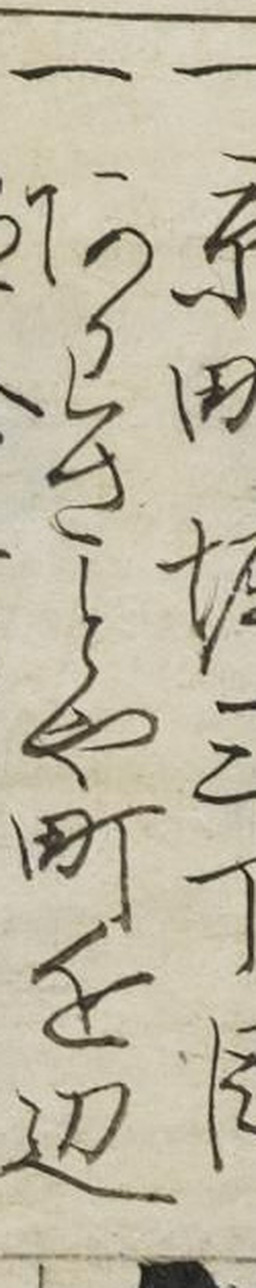一あわさとや町近辺
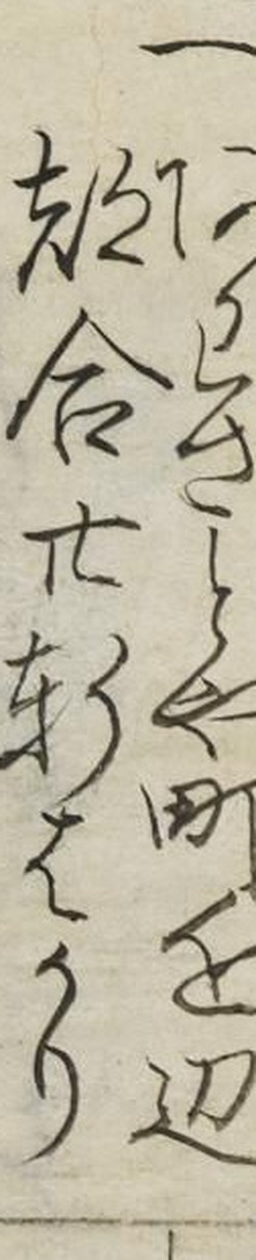都合廿軒はかり
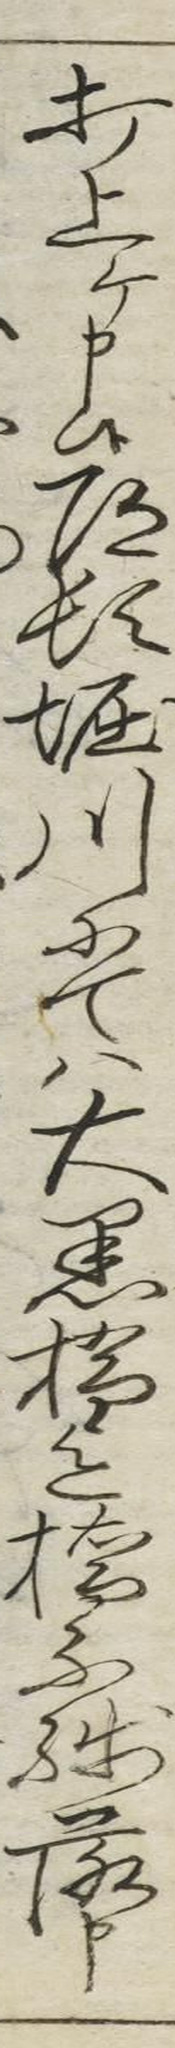打上ケ申し候道頓堀川にてハ大黒橋迄橋不残落申
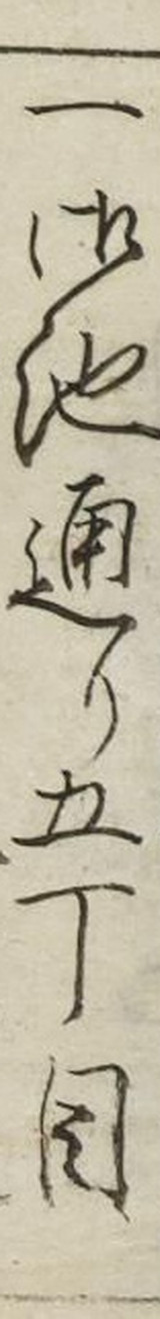一御池通り五丁目
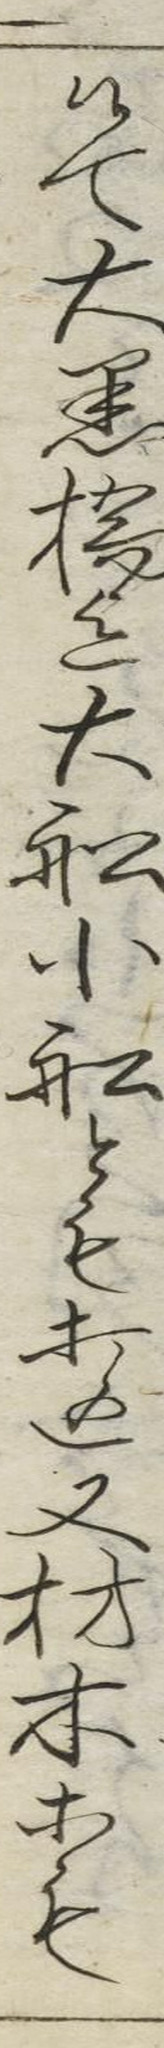候て大黒橋迄大船小船とも打込又材木等も
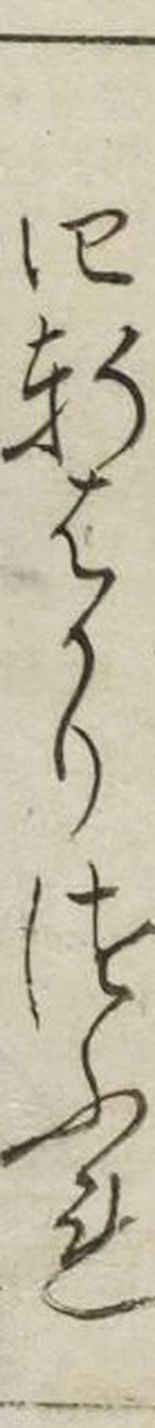四軒はかりつふれ
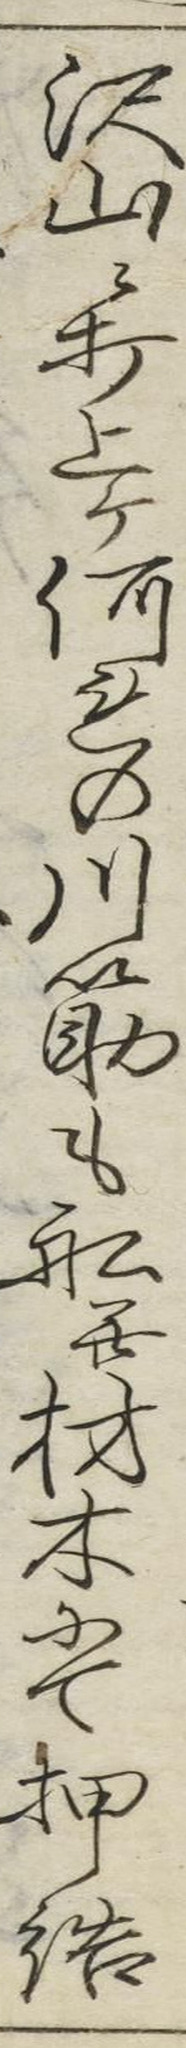沢山ニ打上ケ何れの川筋も船幷材木ニテ押詰
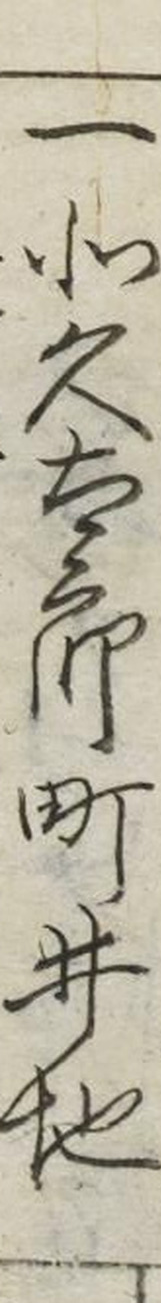一北久太郎町井地
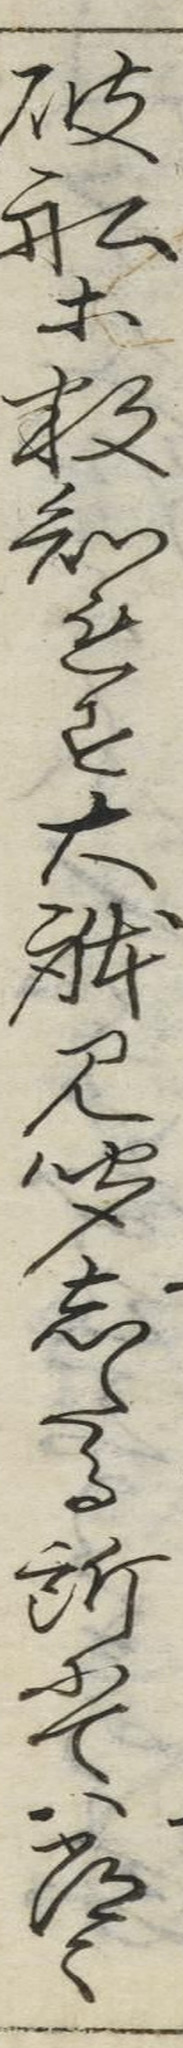破船等数知れす大躰見聞したる所にてハ常〻
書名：大地震實録
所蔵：東京大学地震研究所図書室 Earthquake Research Institute Library, The University of Tokyo, JAPAN
